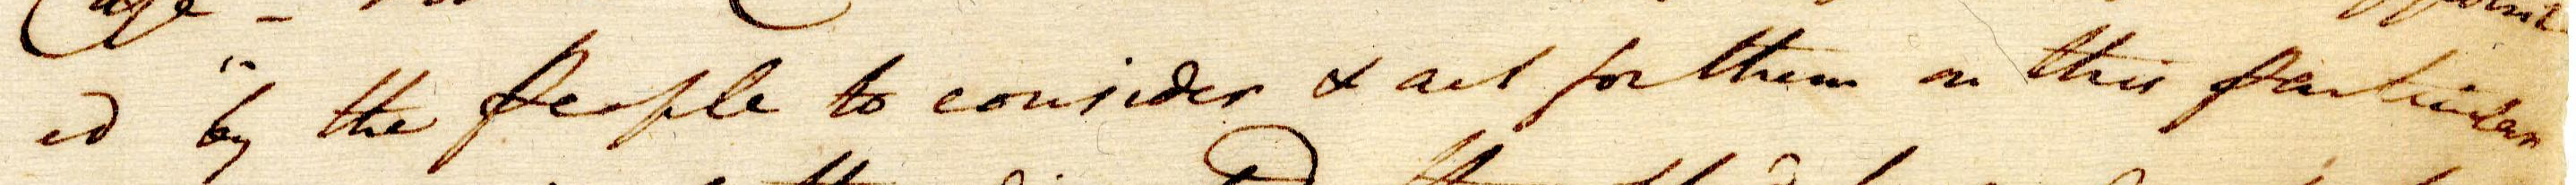-ed by the People to consider & act for them on this Particular
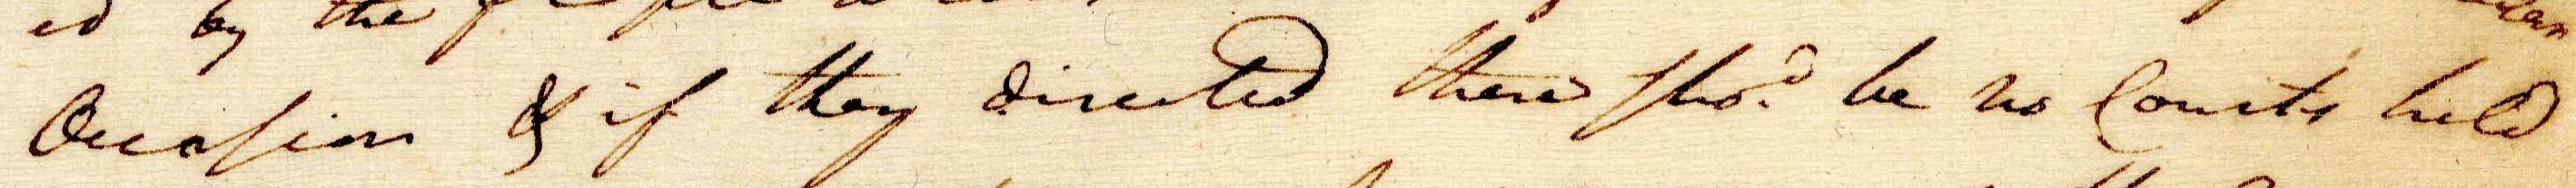Occasion & if they directed there sho^d be no Courts held
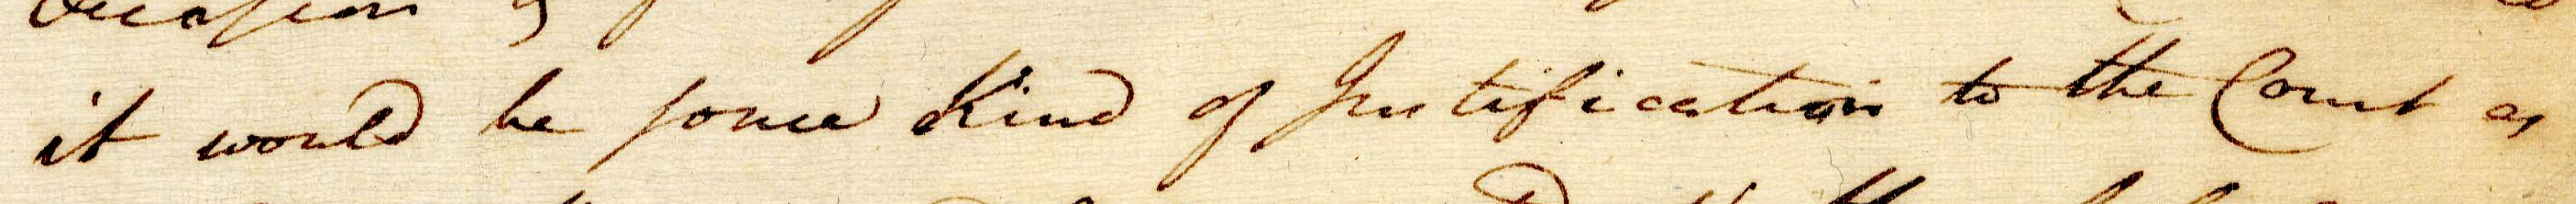it would be some Kind of Justification to the Court as
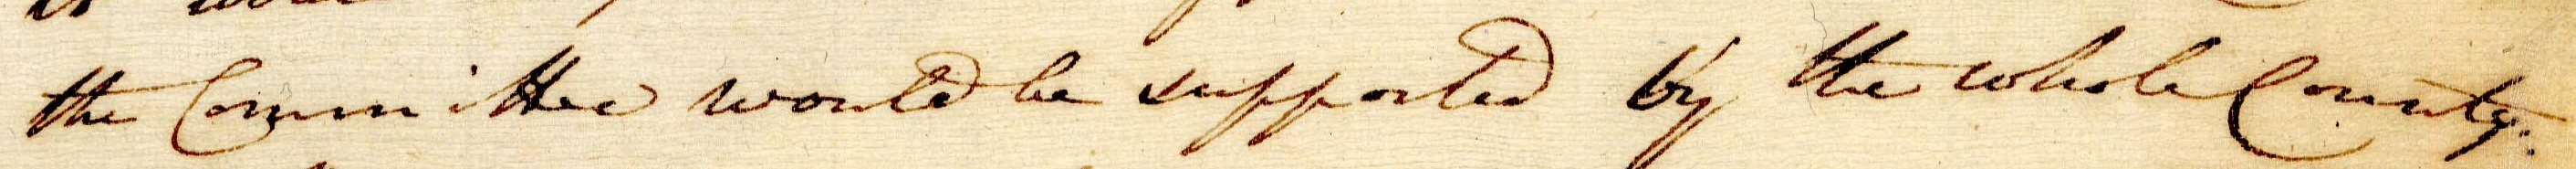the Committee would be supported by the whole County.
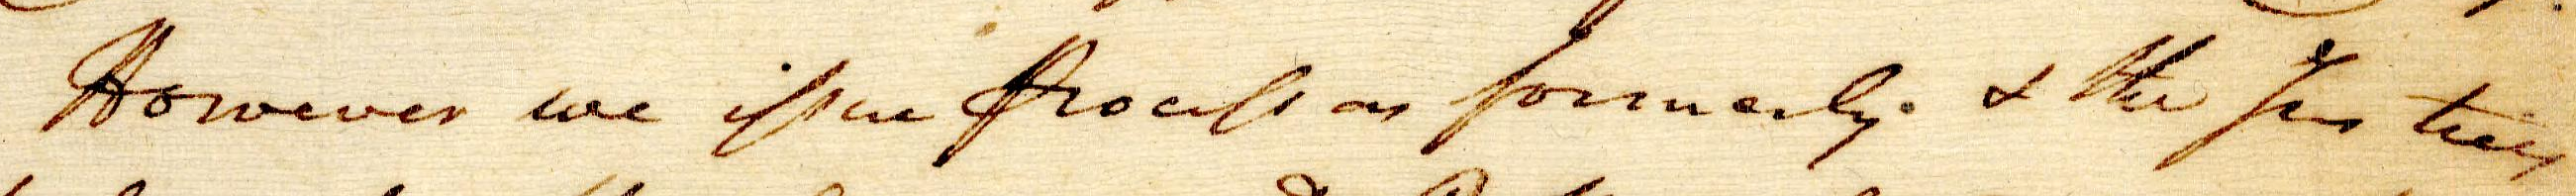However we issue Process as formerly & the Justices
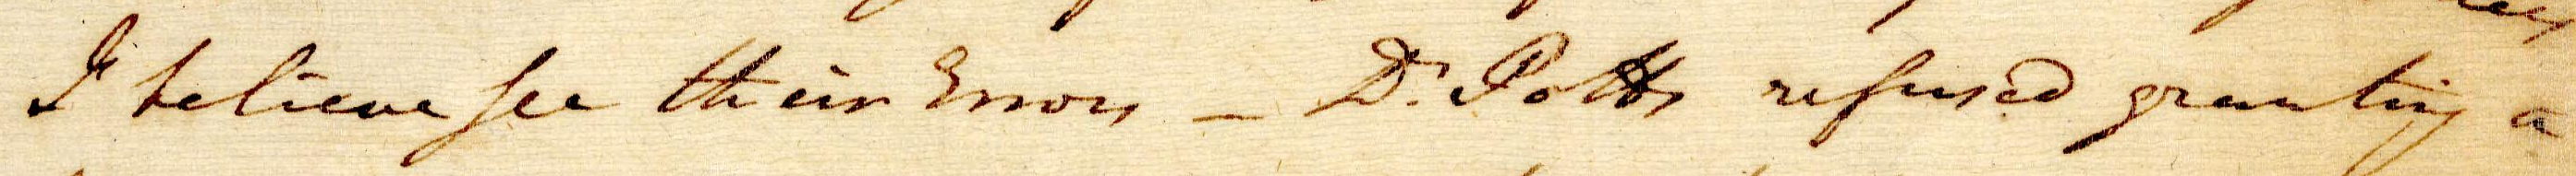I believe see their Errors. Dr. Potts refused granting a
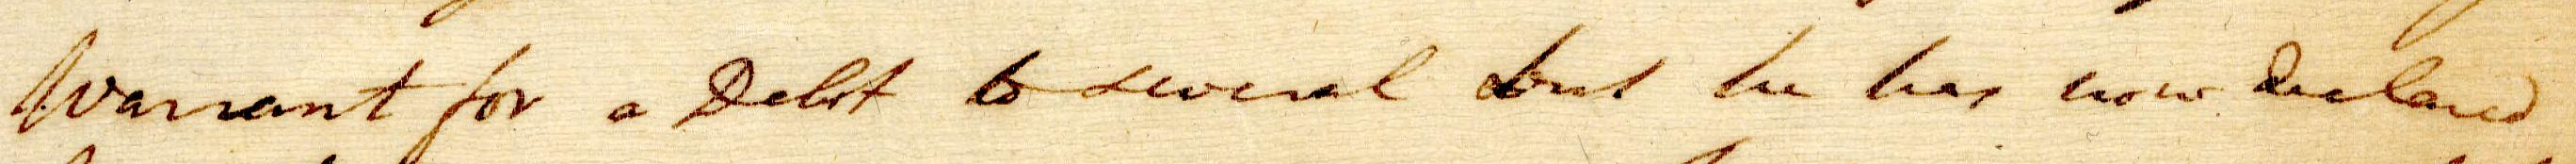warrant for a Debt to several but he has now declared
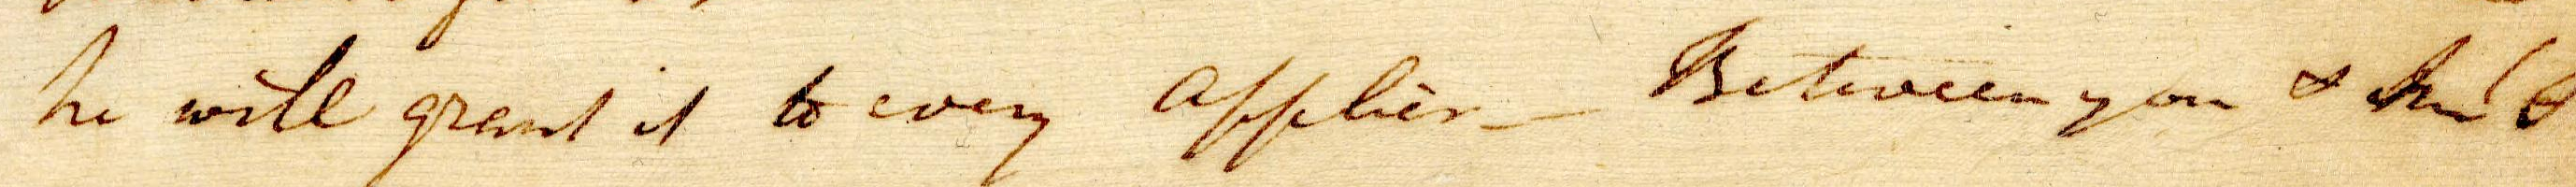he will grant it to every Applier. Between you & [__]
